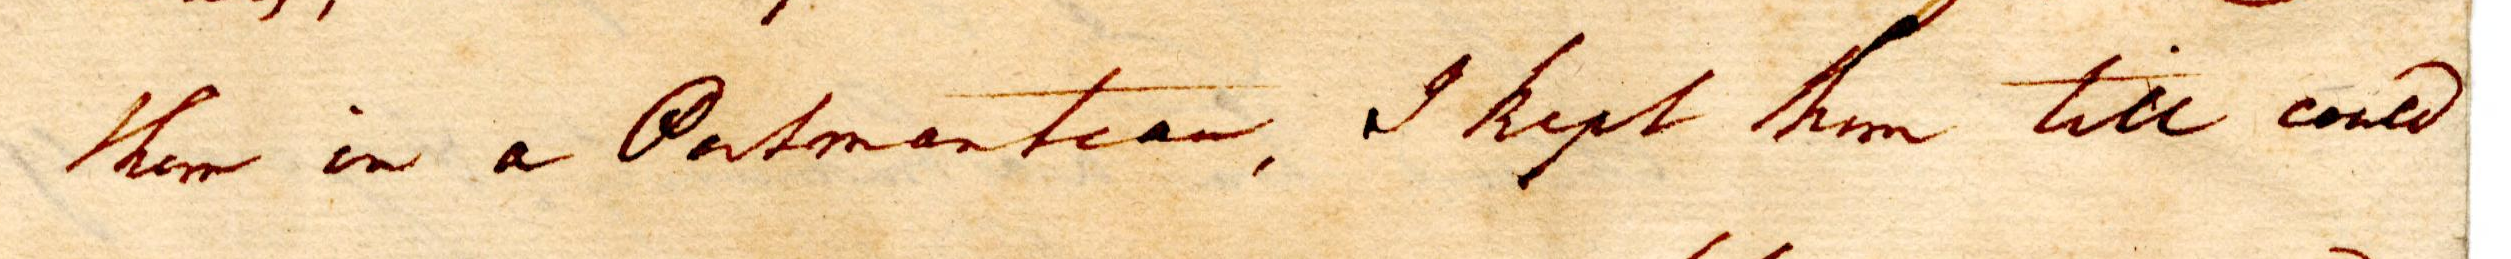them in a Portmanteau, I kept them till could
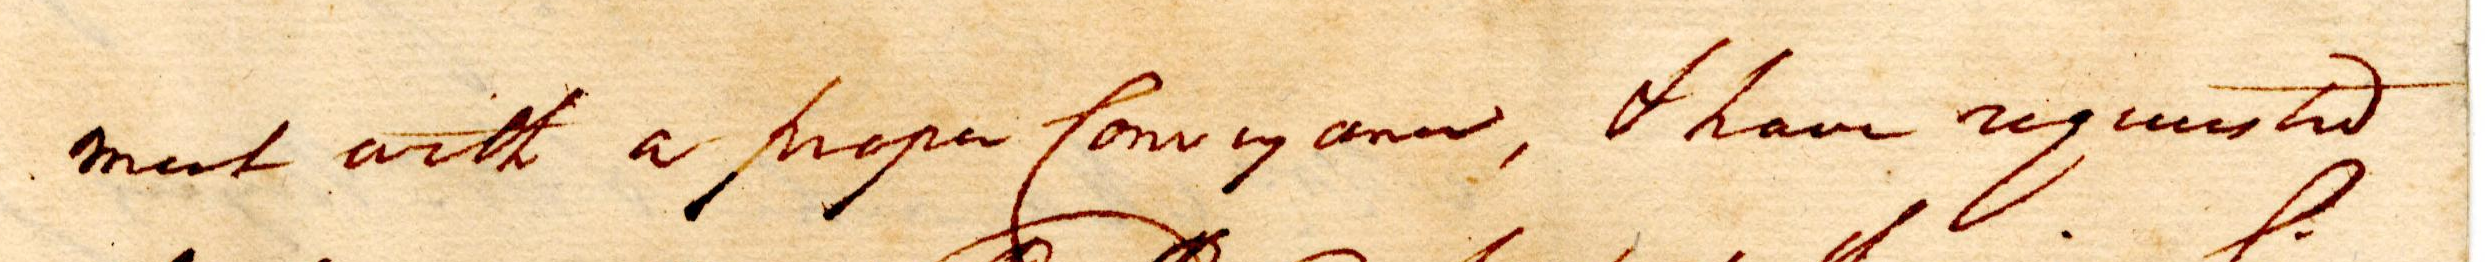meet with a proper conveyance, & have requested
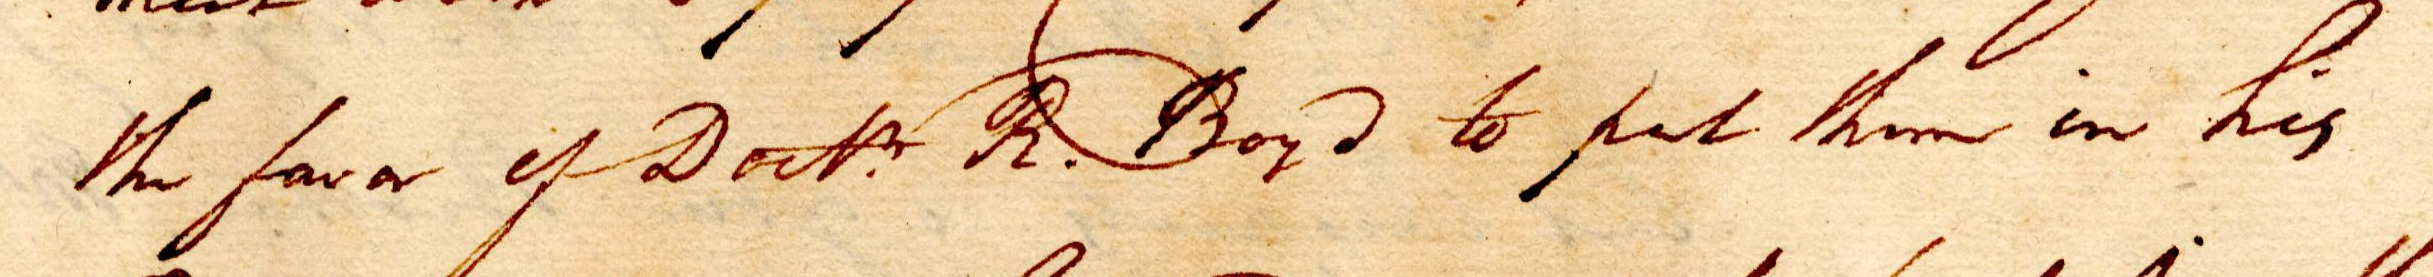the favor of Doct^r. R. Boyd to part them in his
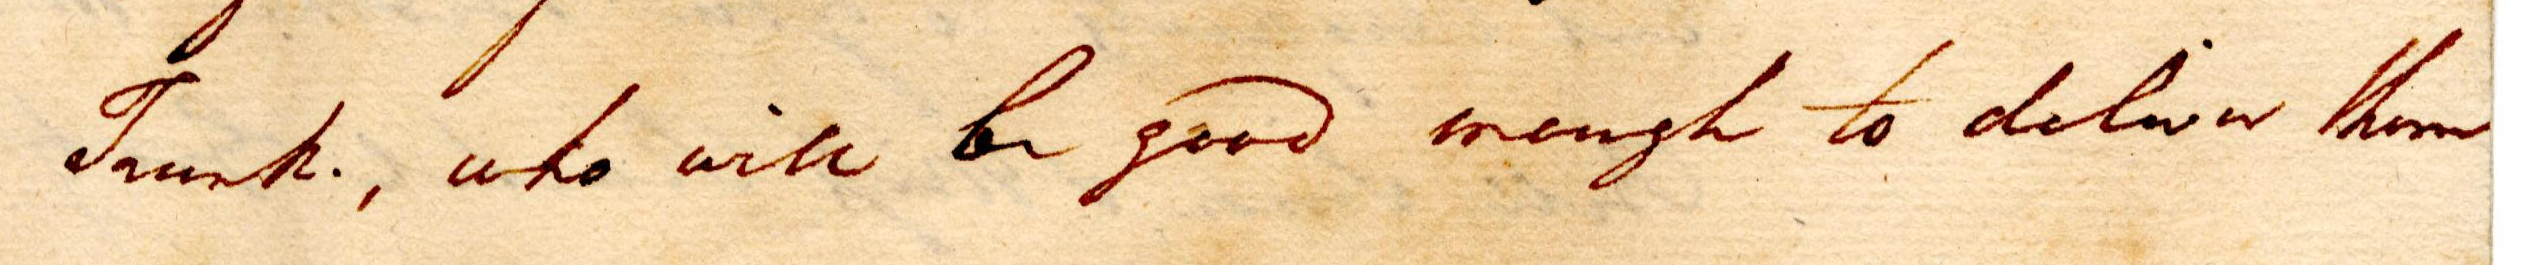Trunk, who will be good enough to deliver them
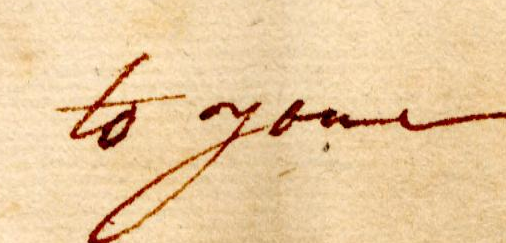to you
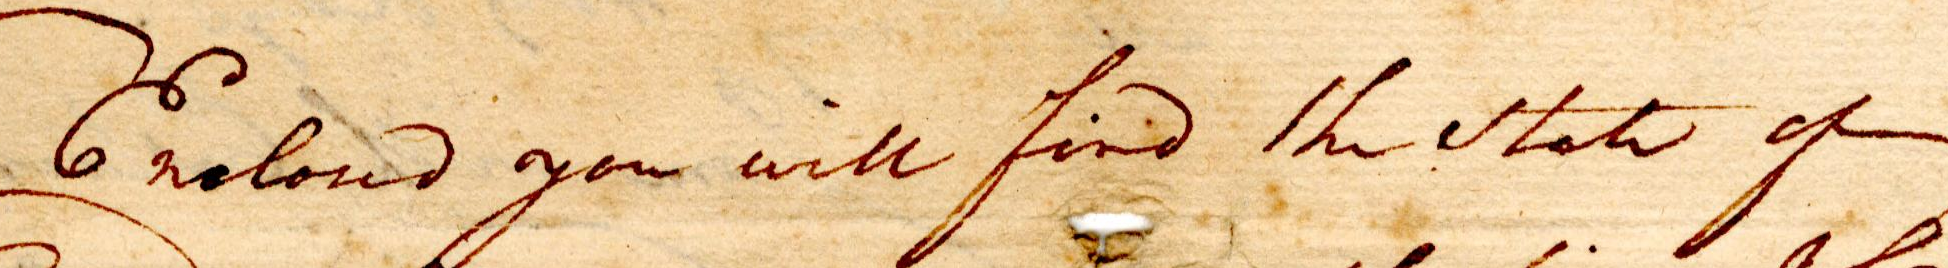Enclosed you will find the stack of
